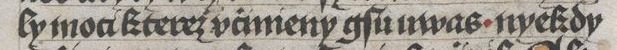ly moci ktereż vċinieny gſu uwas.nyekdy
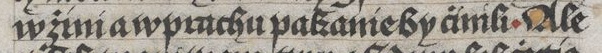w żíni a w prachu pakanie by ċinili.Ale
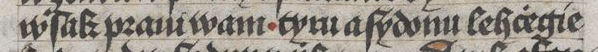wẛak praui wam.tyru a ſydonu lehċegíe
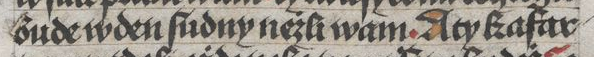bude to wden ſudny neżli wam.A ty kafar¬
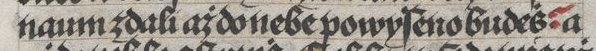naum zdali aż do nebe powyẛeno budeṡ?a
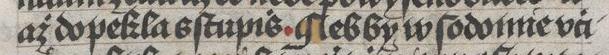aż dopekla sſtupiṡ.Neb by w ſodomie vċi¬
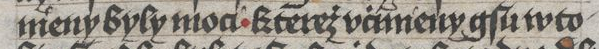nieny byly moci.ktereż vċinieny gſu w to¬
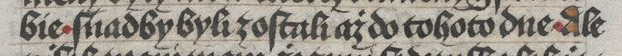bie.ſnad by byli zoſtali aż do tohoto dne.Ale
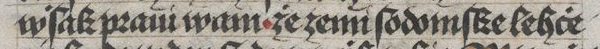wẛak praui wam.że zemi ſodomſke lehċe¬
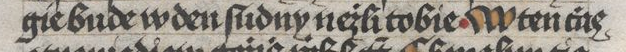gie bude w den ſudny neżli tobie.Wten ċas
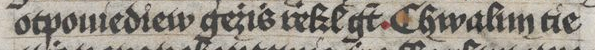otpouiediew geżíṡ ṙekl ḡt.Chwalim tie
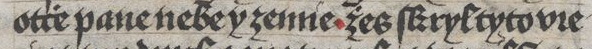otċe pane nebe y zemie.żes ſkryl tyto vie¬
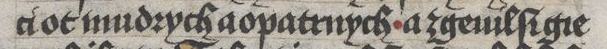ci ot mudrych a opatrnych.a zgeuil ſi gie
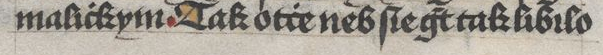maliċkym.Tak otċe neb ſie ḡt tak libilo
